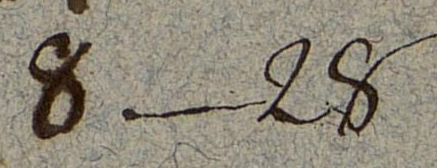8-28
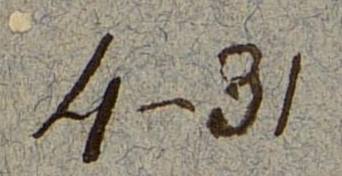4-31
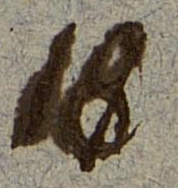18
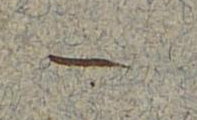-
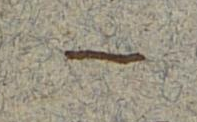-
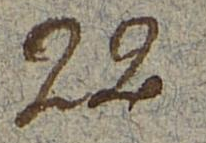22
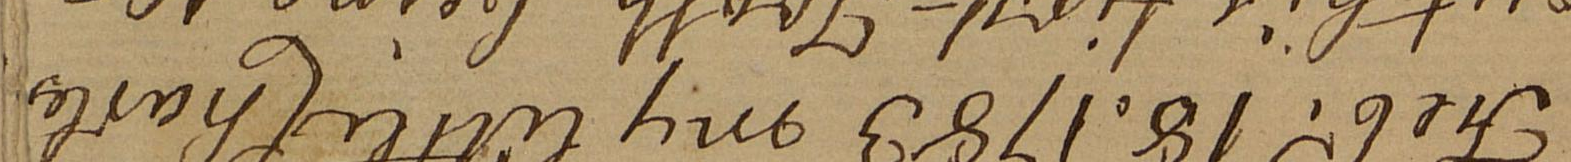Feb^y. 18. 1783 my little Charles
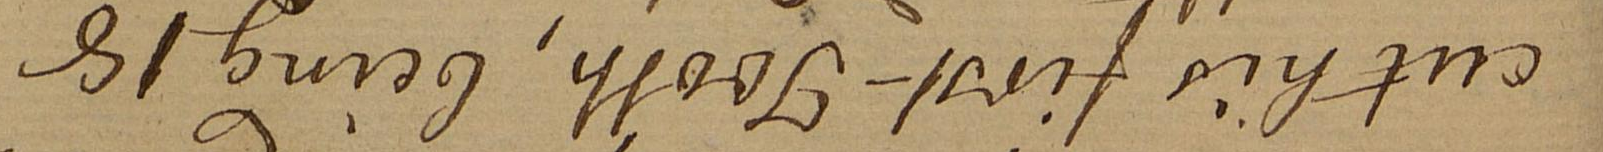cut his first Tooth, being 18
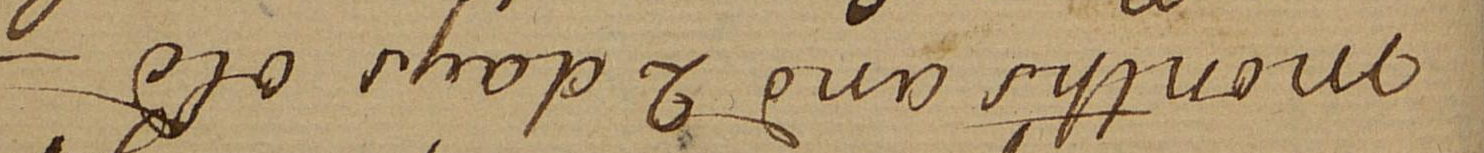months and 2 days old-
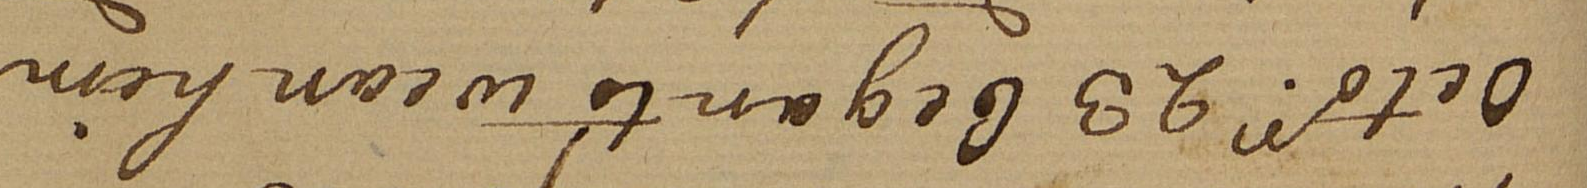Octo^r. 23 began to wean him
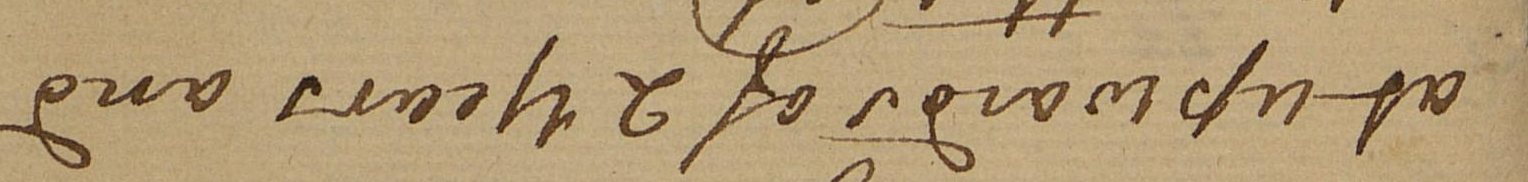at upwards of 2 years and
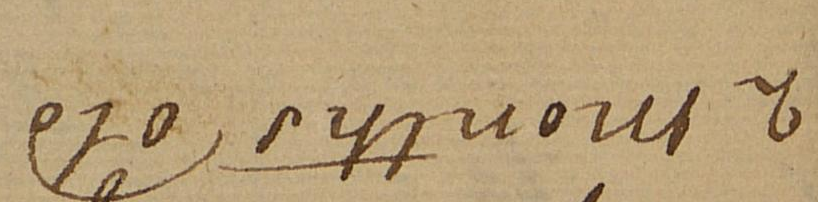2 months old
